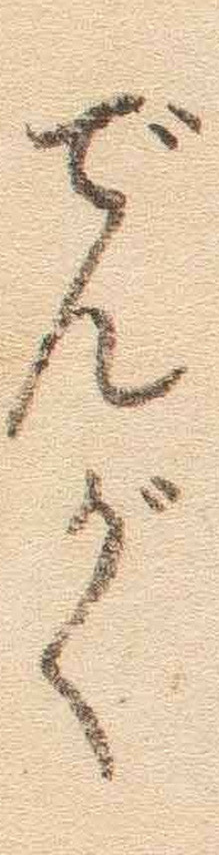でんがく

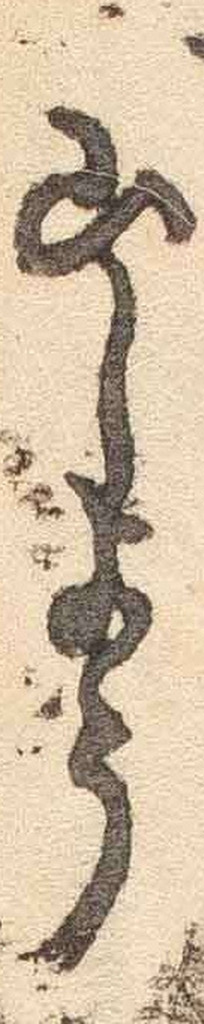山しよう
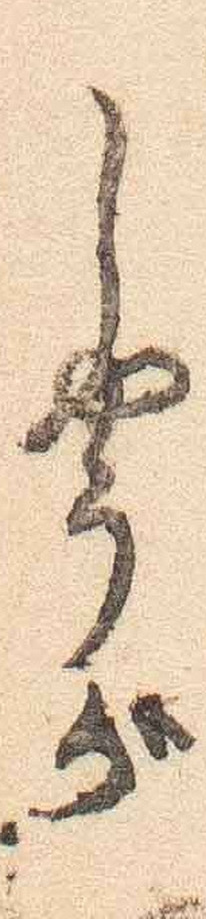しやうが
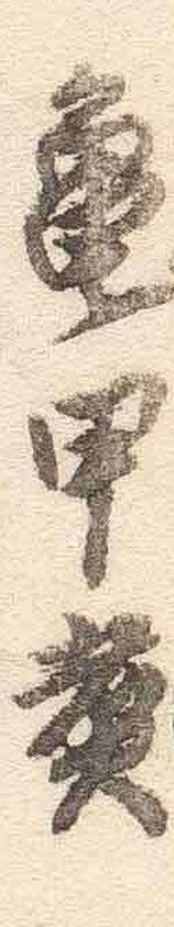亀甲煎
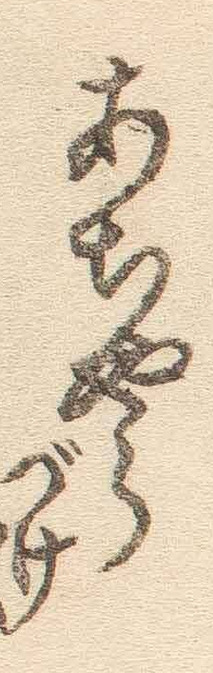あちやらだけ

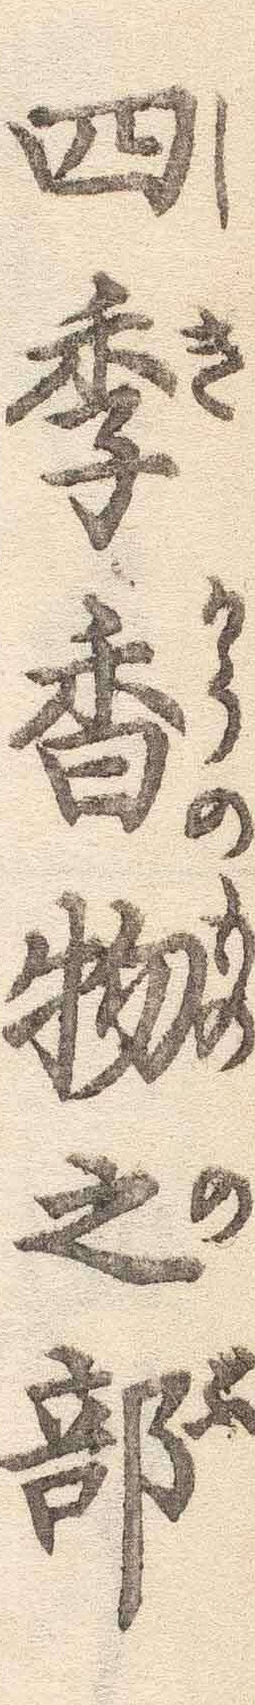四季香物之部
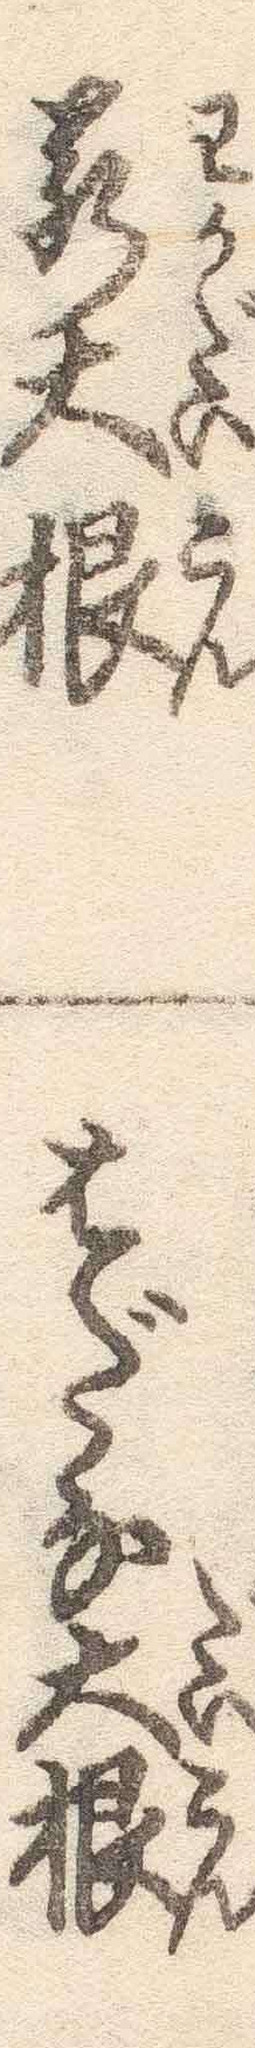若大根はだな大根
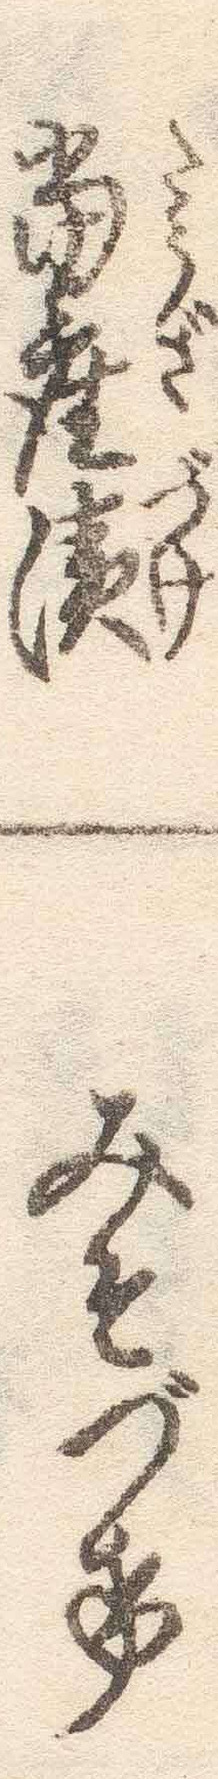当座漬みそづけ

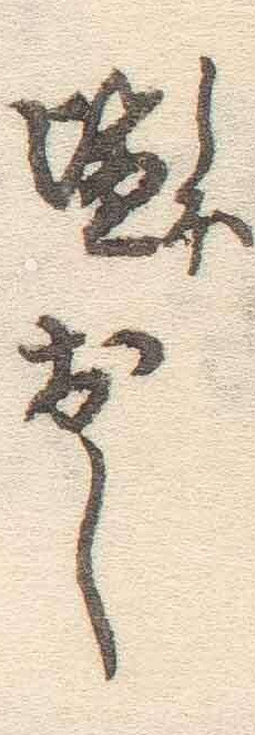塩おし
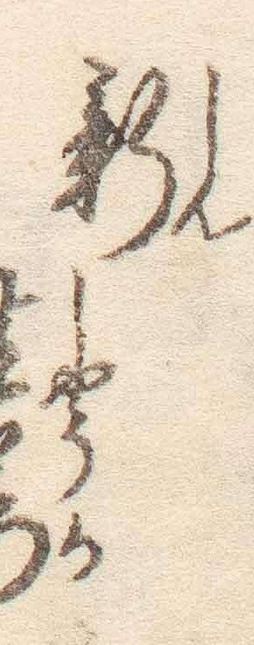菜しやうが

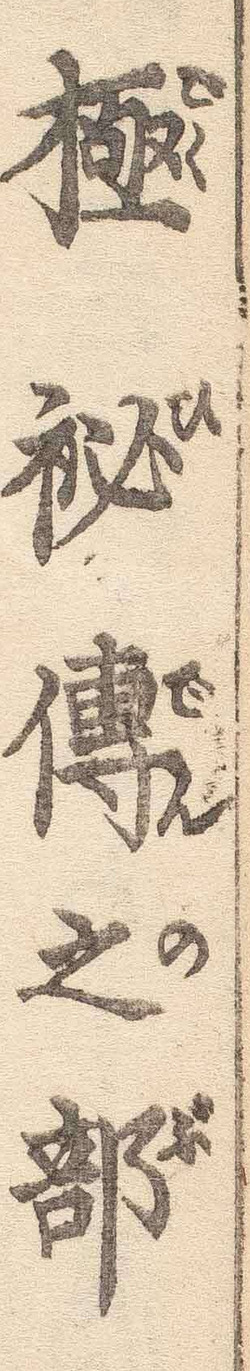極秘伝之部
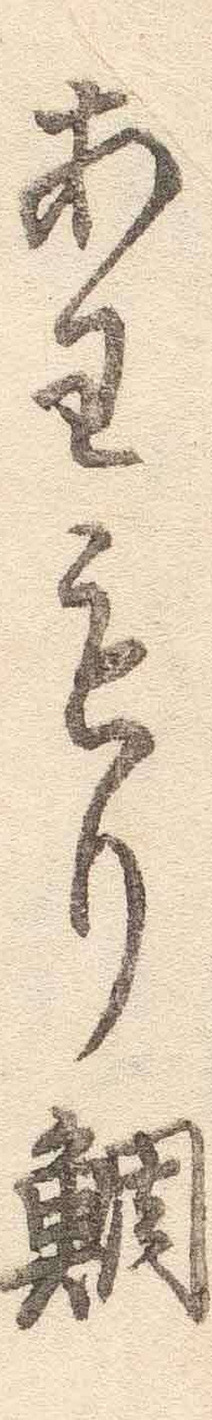あわもり鯛
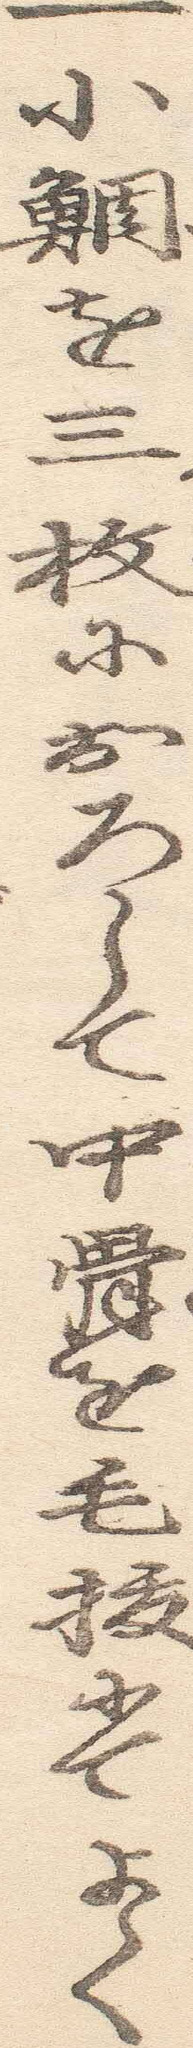一小鯛を三枚におろして中骨を毛抜にてよく
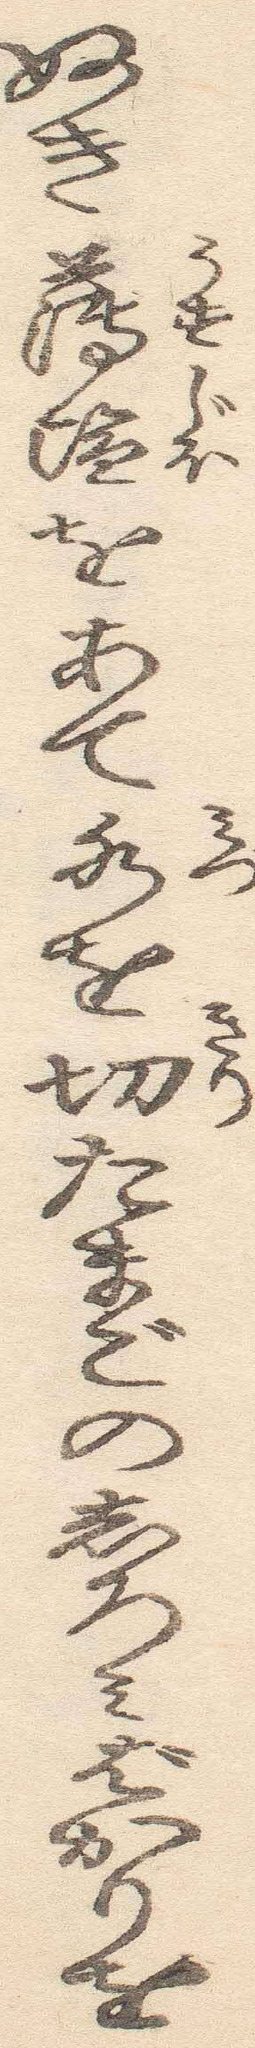ぬき薄塩をあて水を切たまごのしろみばかりを
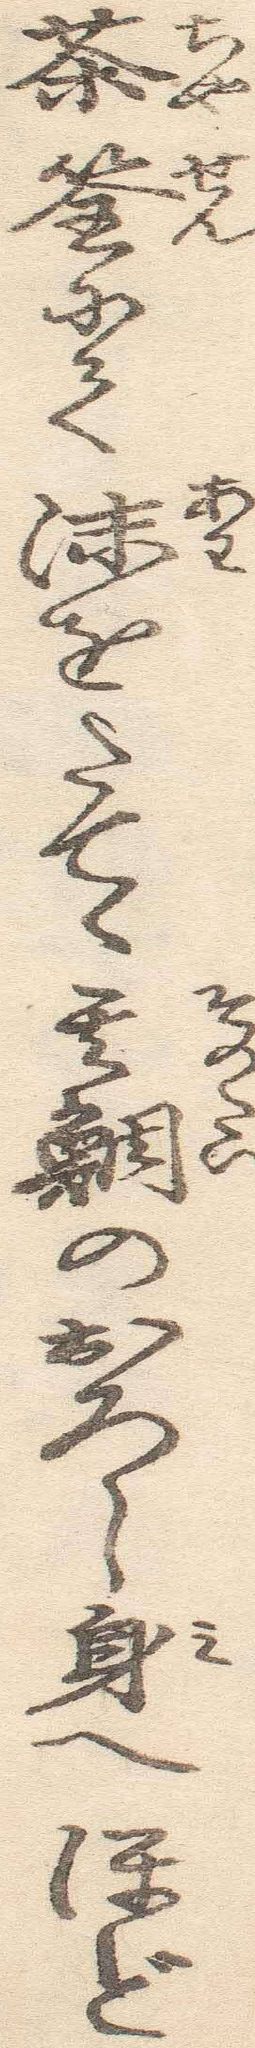茶筌にて沫をたてゝ其鯛のおろし身へほど
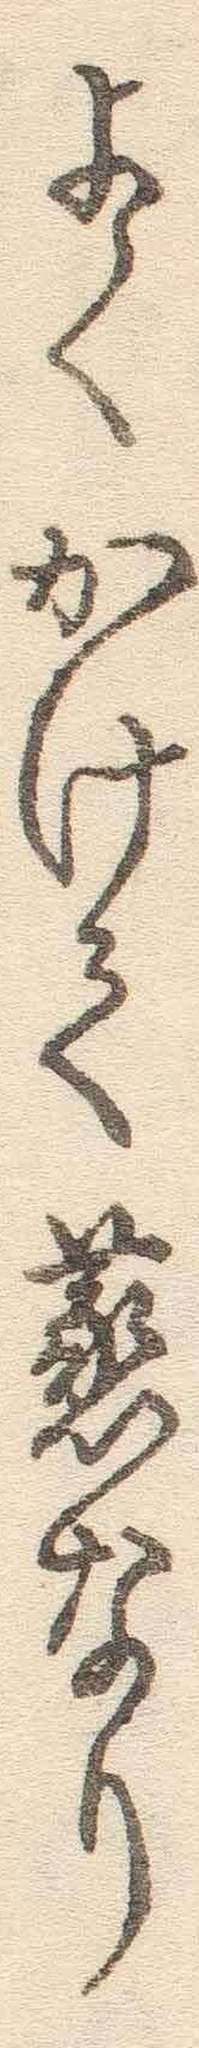よくかけて蒸なり
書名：料理通
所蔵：東京学芸大学附属図書館 国文学研究資料館
